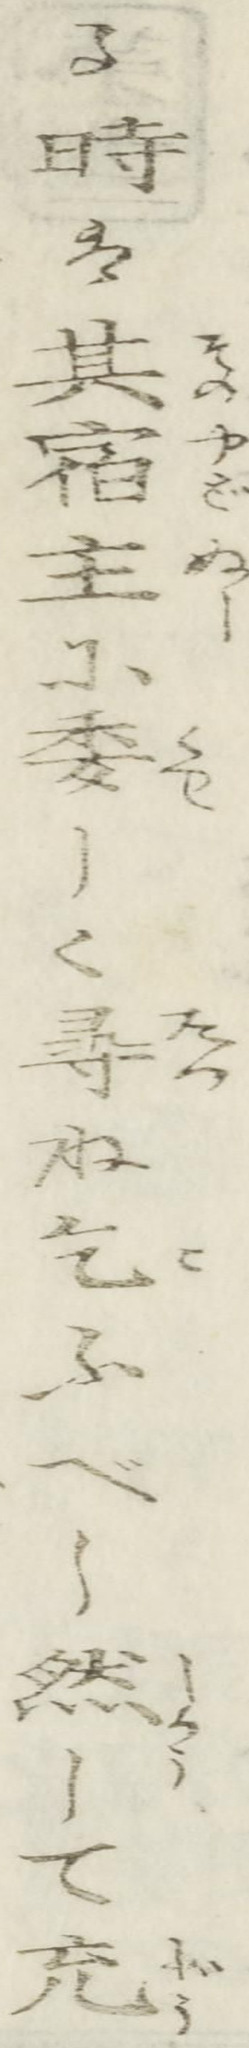る時は其宿主に委しく尋ね乞ふべし然して充
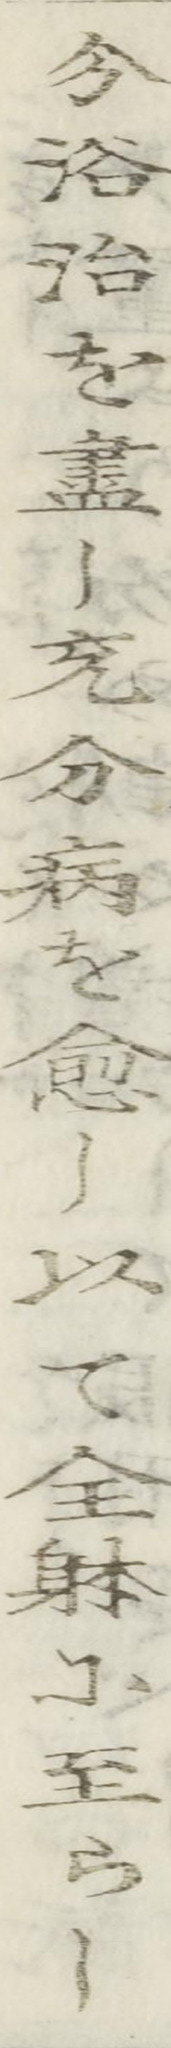分浴治を尽し充分病を愈し以て全体に至らし
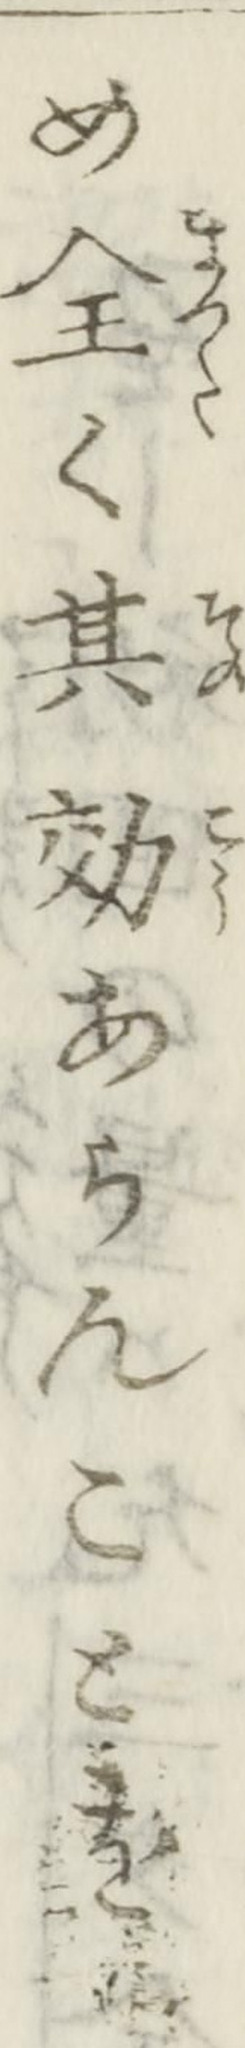め全く其効あらんことを
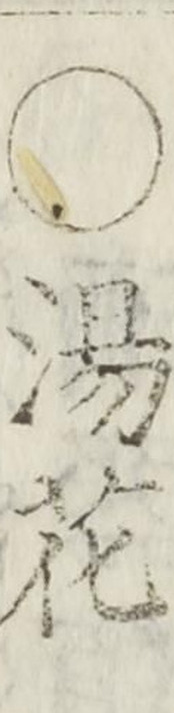〇湯花
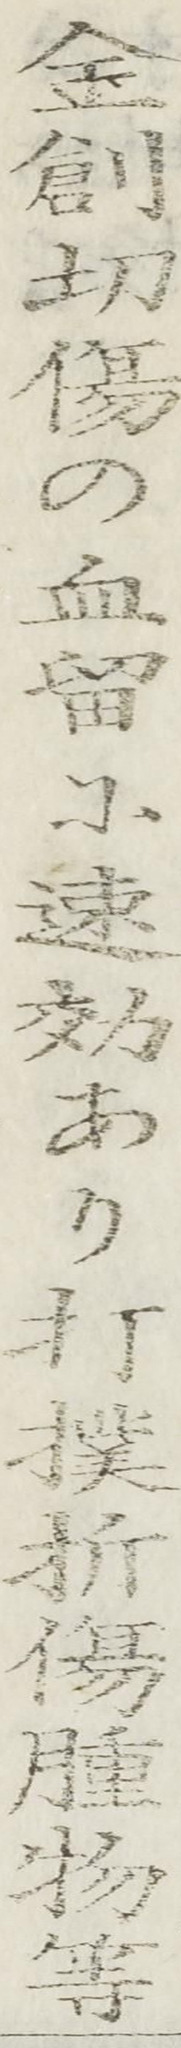金創切傷の血留に速効あり打撲折傷腫物等
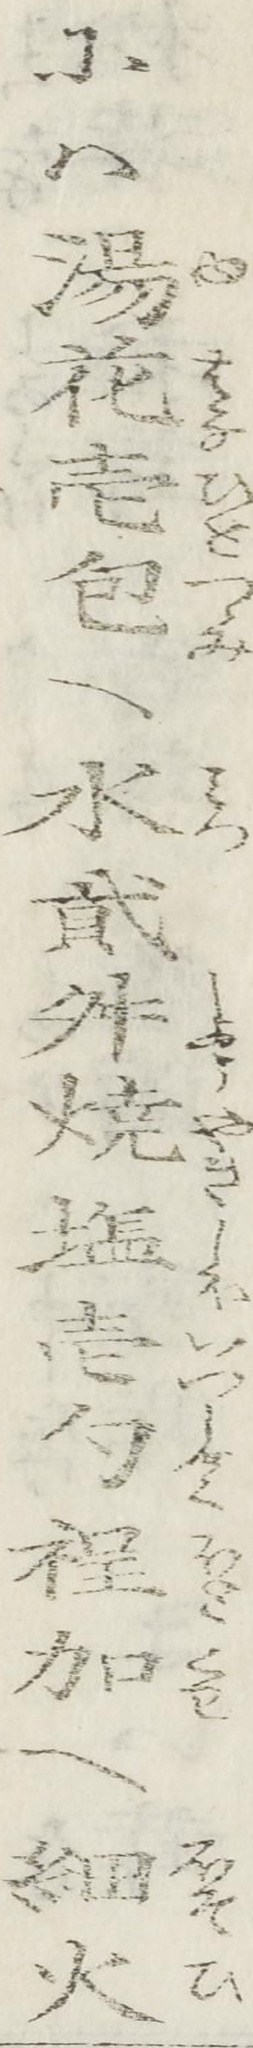には湯花壱包へ水弐升焼塩壱勺程加へ細火
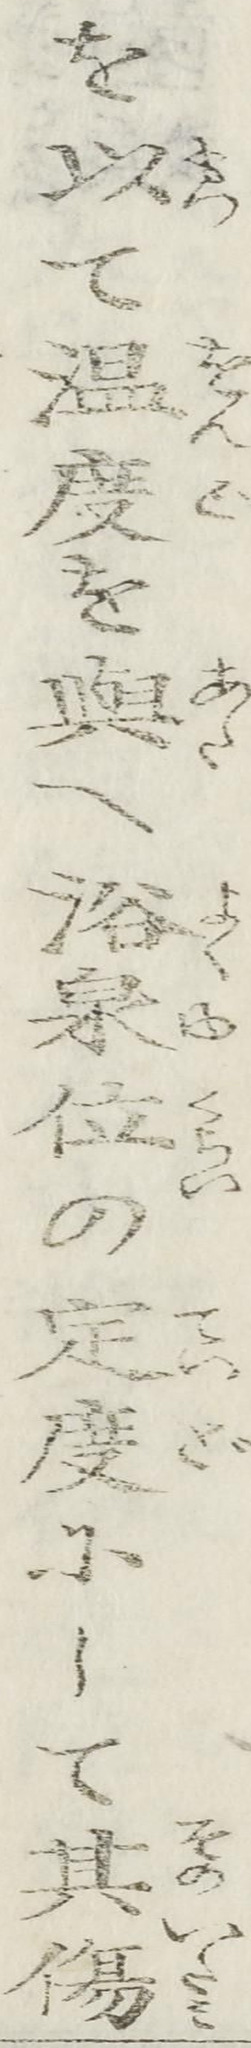を以て温度を与へ浴泉位の定度にして其傷
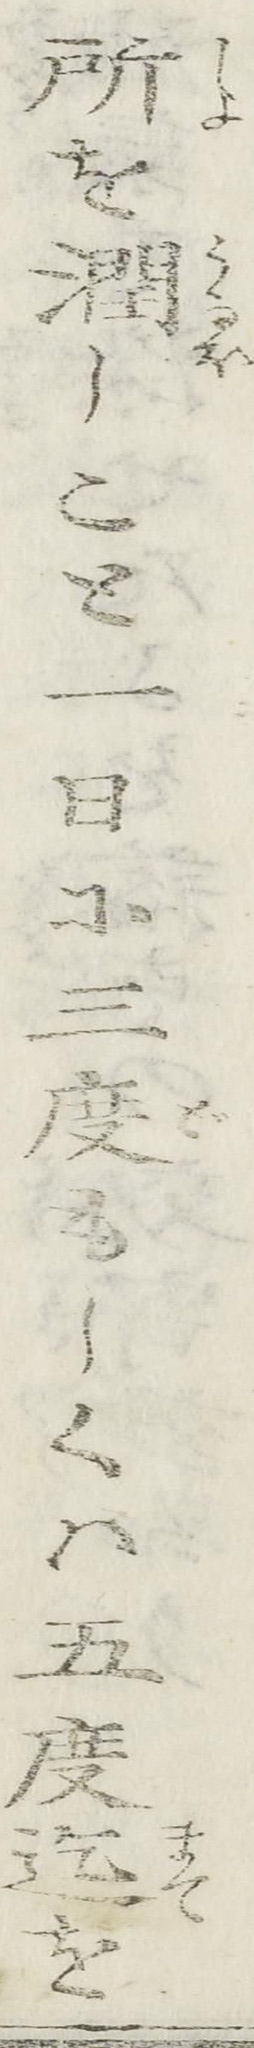所を潤しこと一日に三度もしくは五度迄を
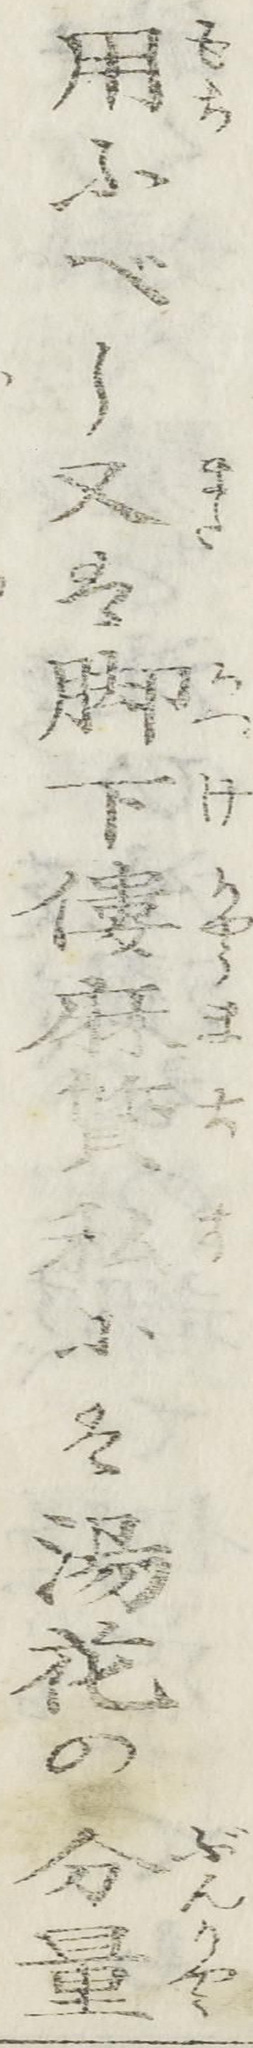用ふべし又は脚気僂麻質私には湯花の分量
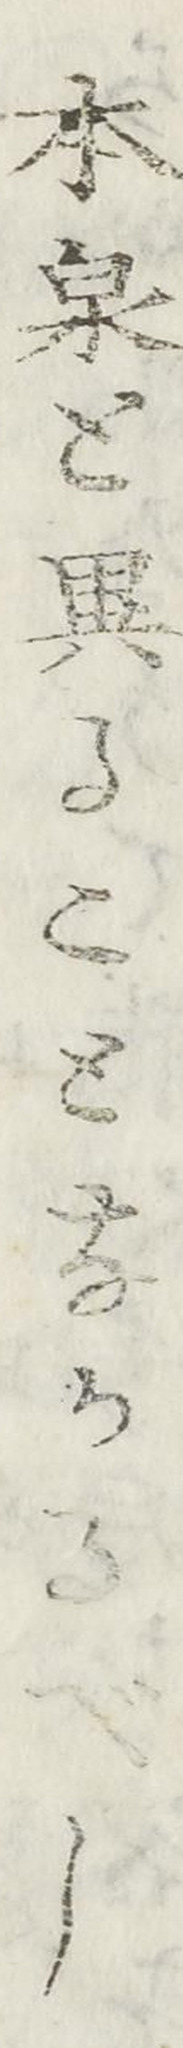本泉と異ることなかるべし
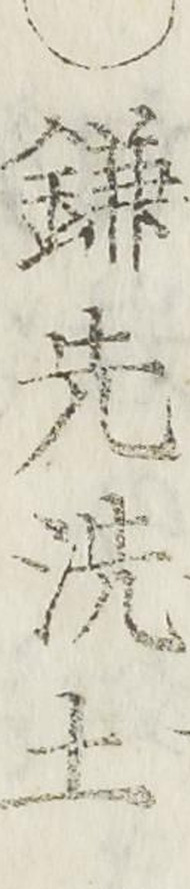〇鎌先洗土

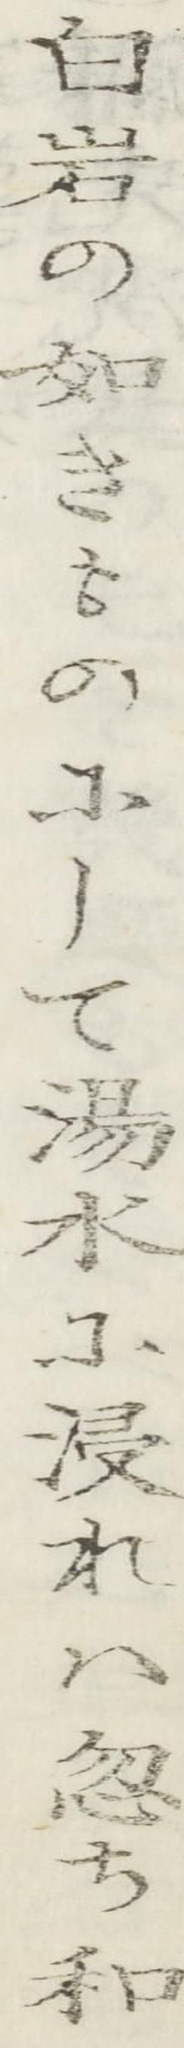白岩の如きものにして湯水に浸れは忽ち和
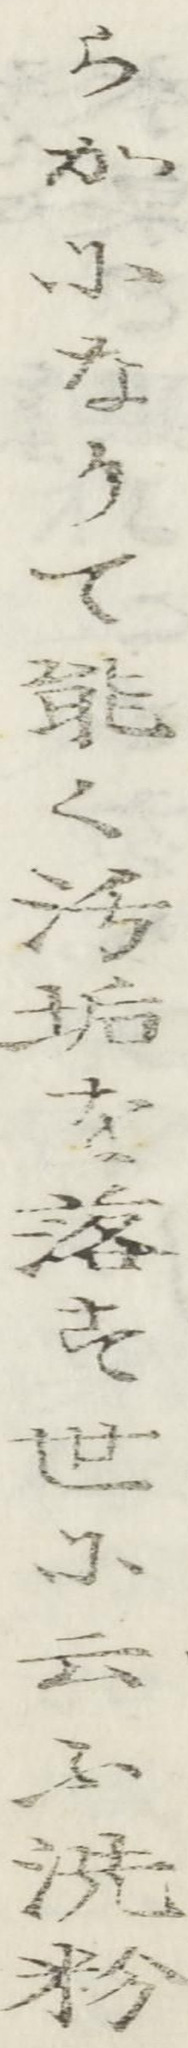らかになりて能く汚垢を落す世に云ふ洗粉
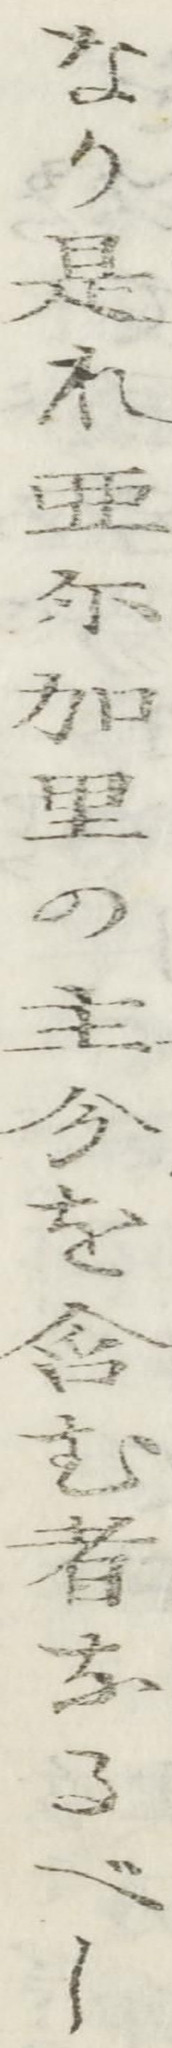なり是れ亜尓加里の主分を含む者なるべし
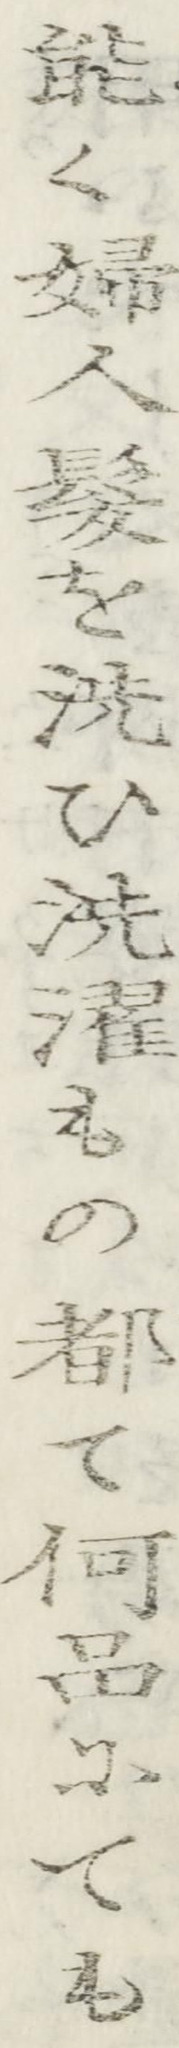能く婦人髪を洗ひ洗濯もの都て何品にても
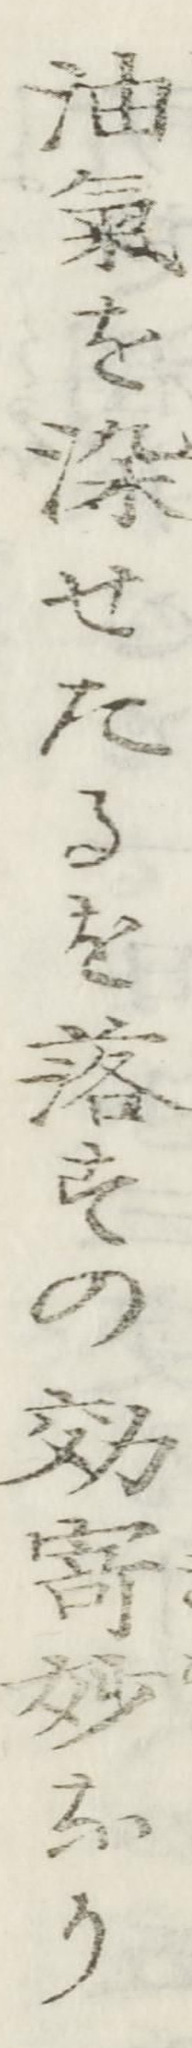油気を染せたるを落すの効寄妙なり
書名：鎌先温泉由來記
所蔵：東京大学地震研究所図書室 Earthquake Research Institute Library, The University of Tokyo, JAPAN
